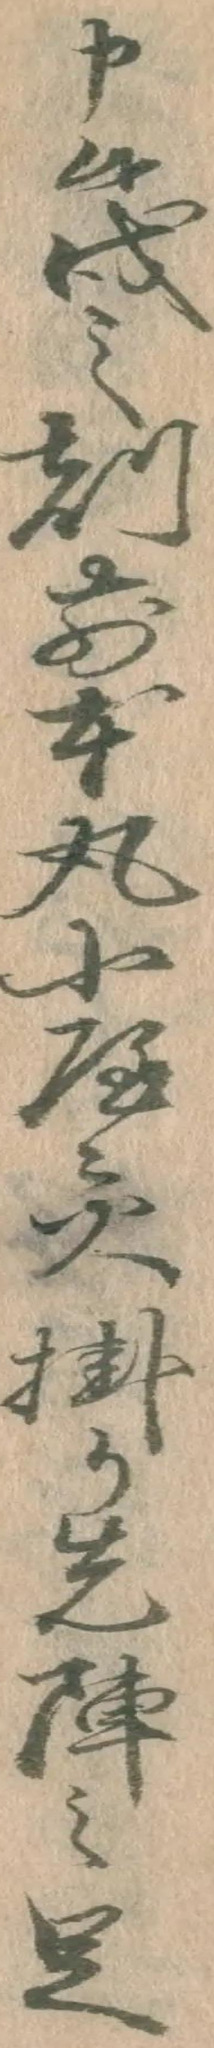申候戌之刻前本丸小屋に火を掛り先陣之足
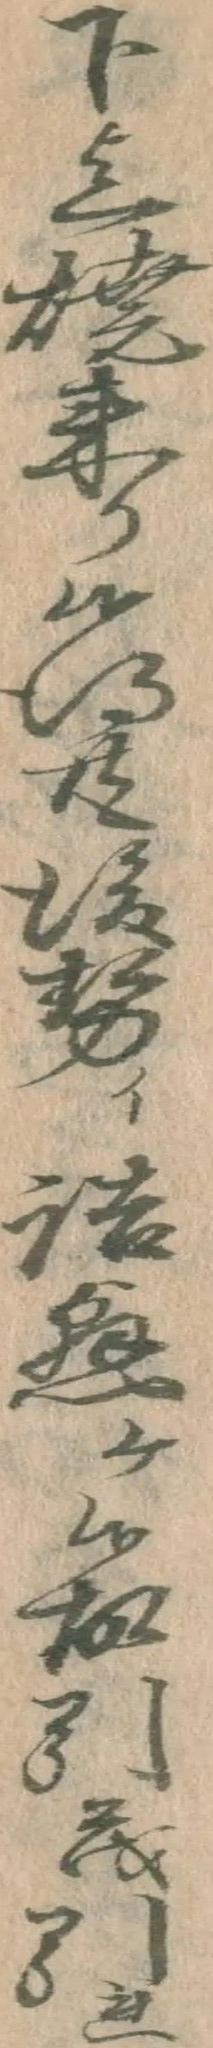下迄焼来り候得共後勢い詰懸け候故引茂引連
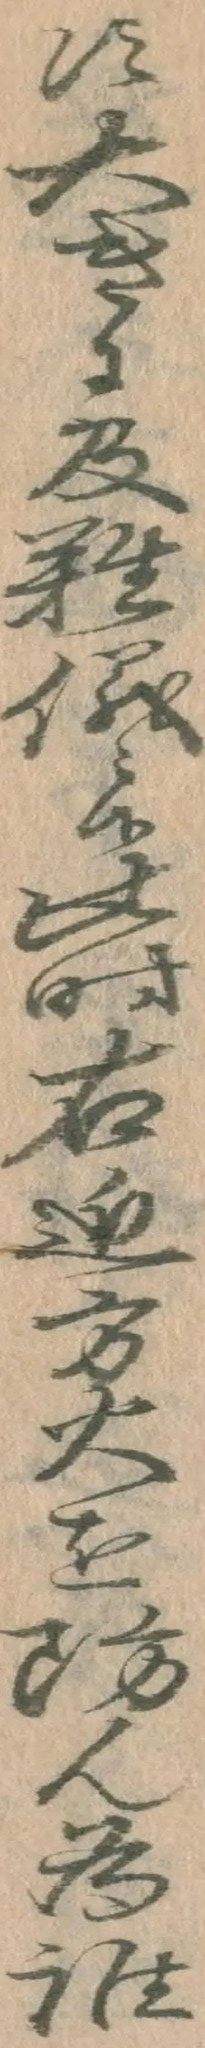須大き尓及難儀に候此時右近方火を防ん為誰
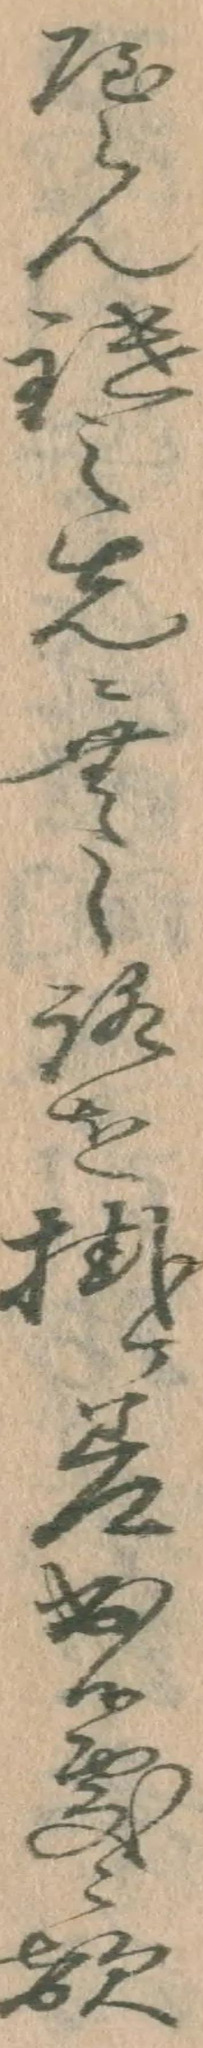屋らん鑓之先に無し路を掛け差出候處に敵
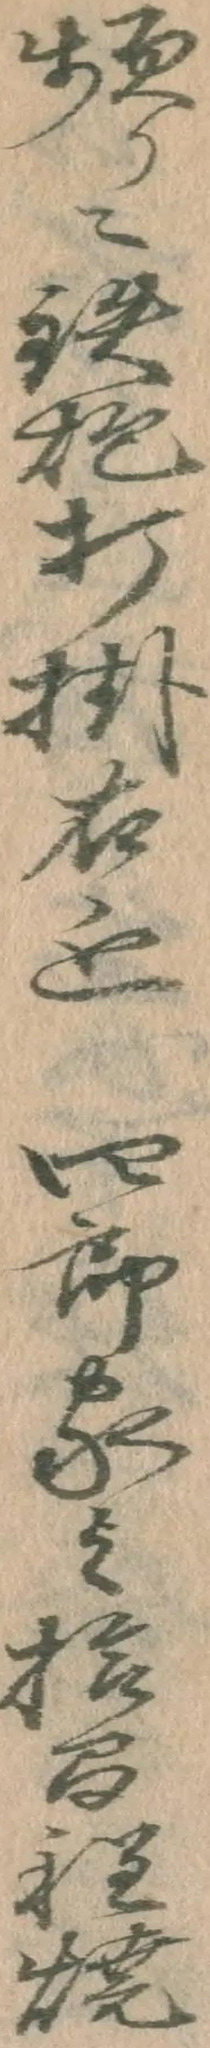頻りに鉄炮打掛右近四郎家与拾間程焼
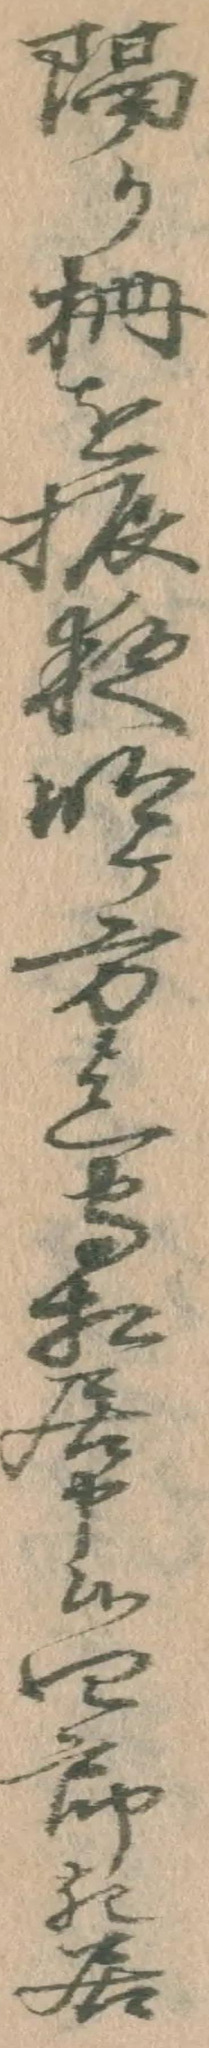隔り柵を振夜明け方迄守相居申候四郎歟居
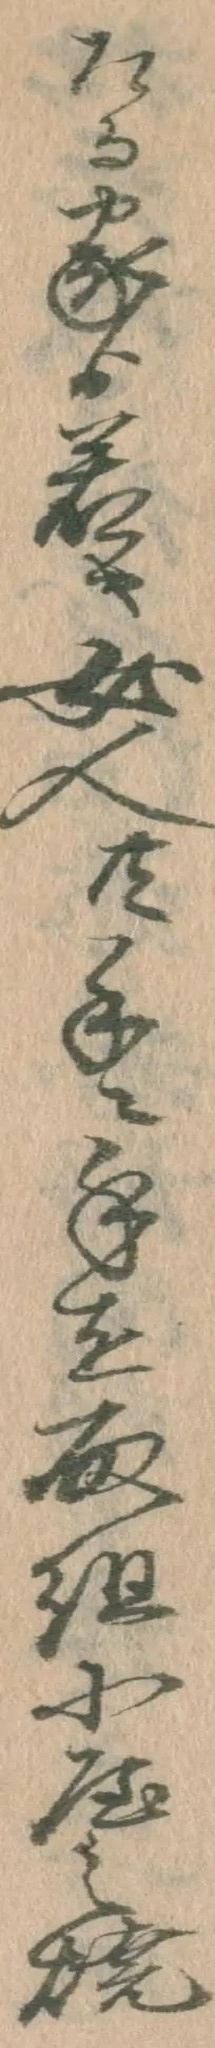たる家ゟ若き女人共手に手を取組小屋之焼
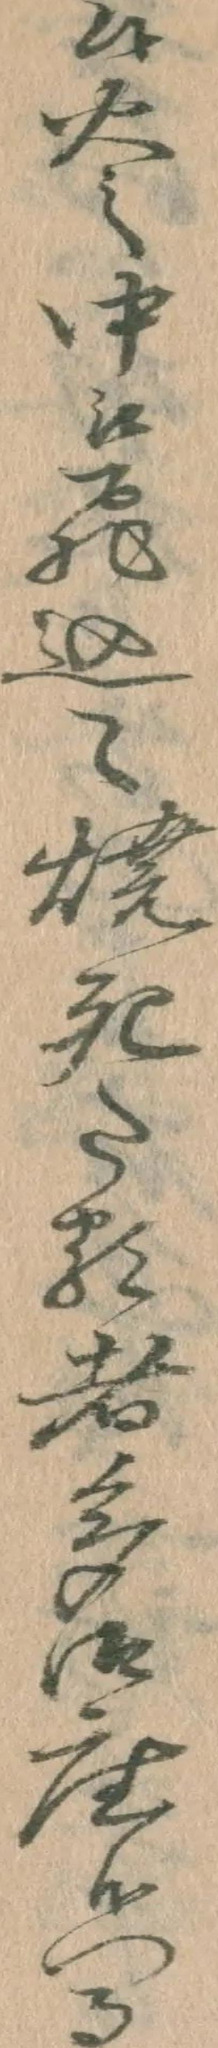候火之中江飛込み焼死た類者多御座候つる
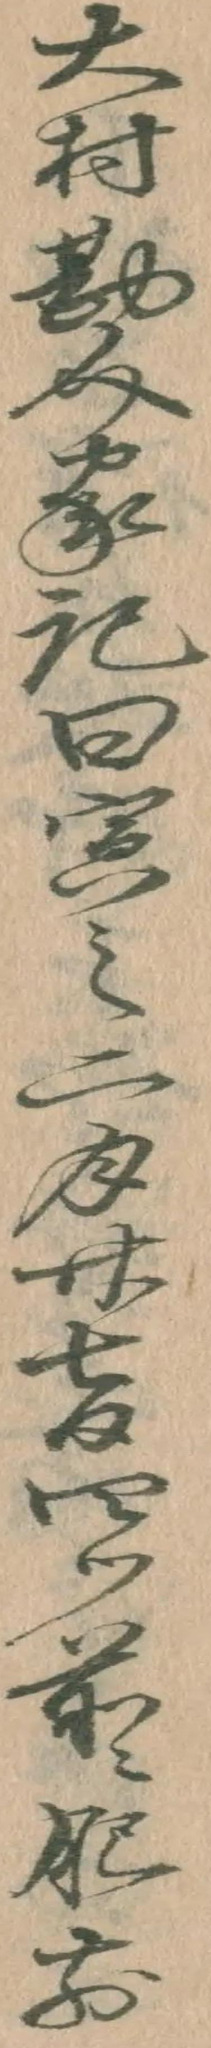大村勘介家記曰寅之二月廿七日四つ前に肥前
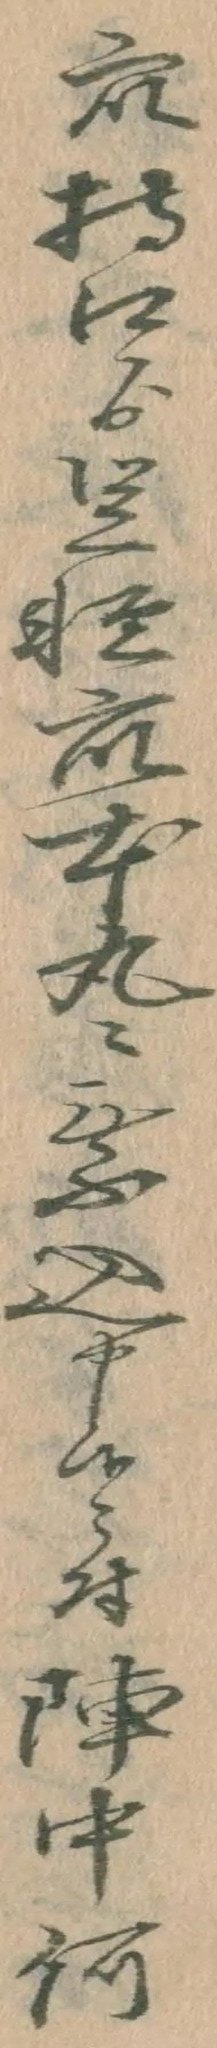衆持口ゟ足軽衆本丸に乗込申候に付陣中何
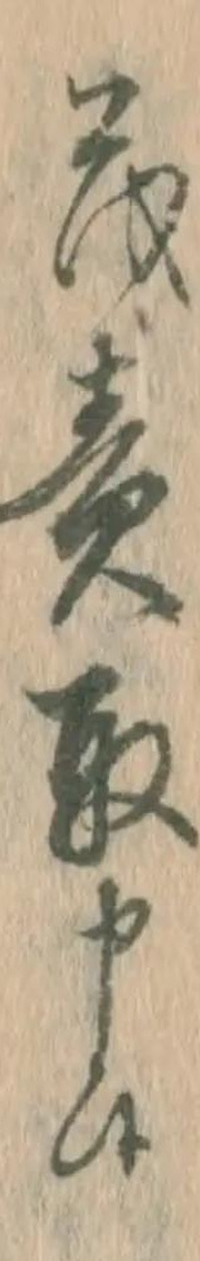茂責取申候
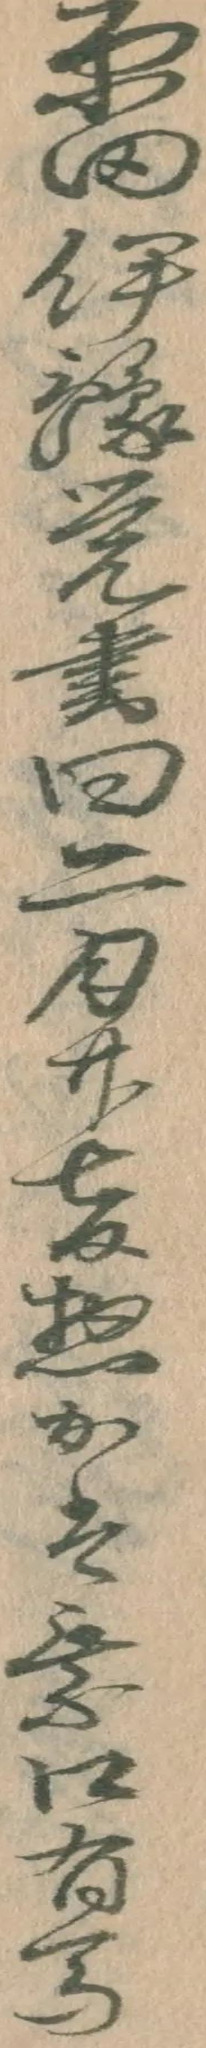原田伊予覚書曰二月廿七日惣か盤乗口有馬
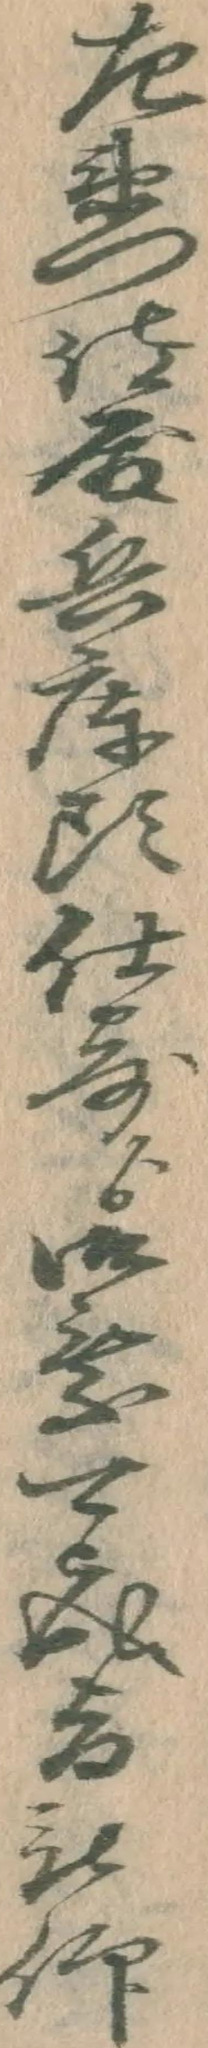左衛門佐殿兵庫頭仕寄ゟ御乗可被成旨被仰
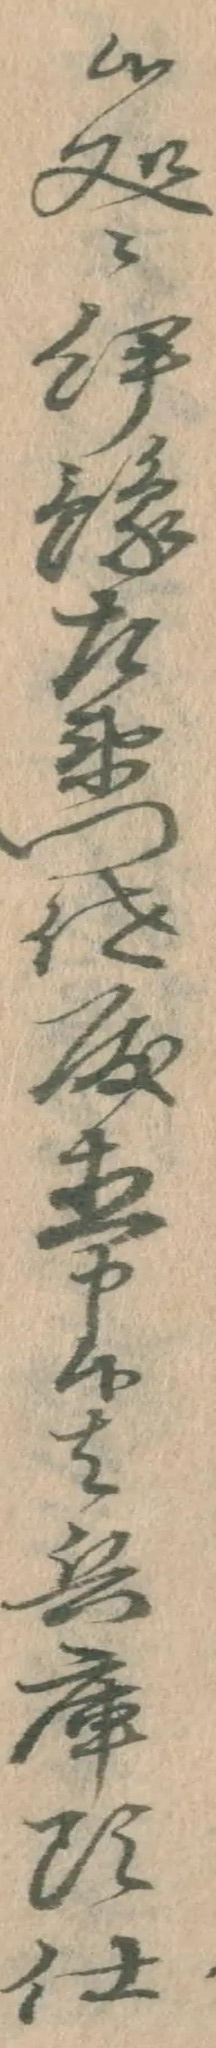候処に伊予左衛門佐殿直申候者兵庫頭仕
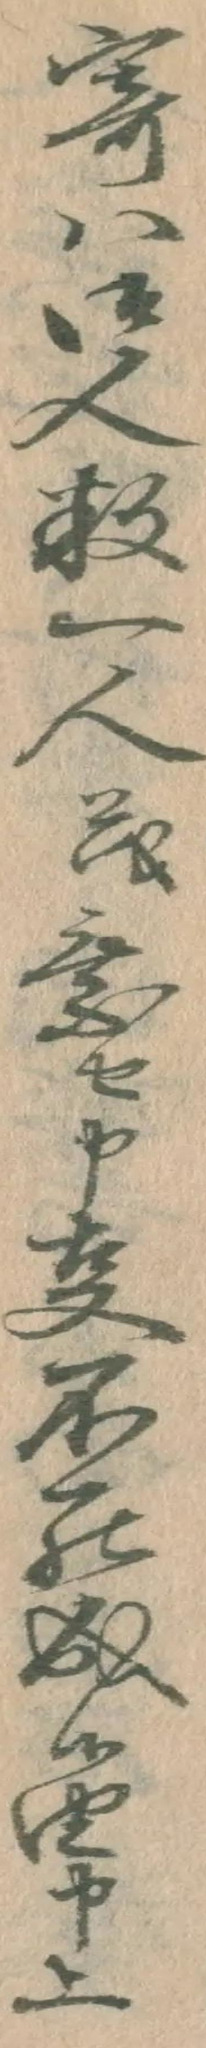寄は御人数一人茂乗せ申事不罷成候由申上
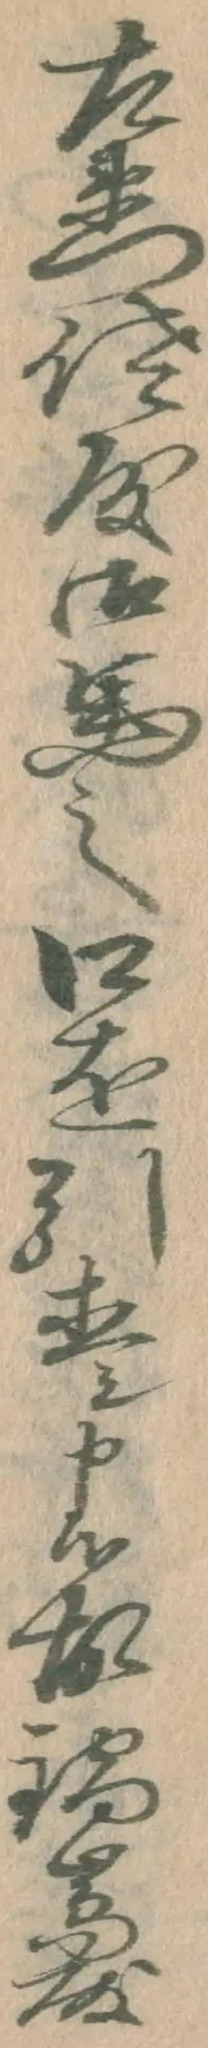左衛門佐殿御馬之口を引直し申候故鍋島殿
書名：切支丹御退治記 49巻. [8]
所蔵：国立国会図書館 National Diet Library, JAPAN
